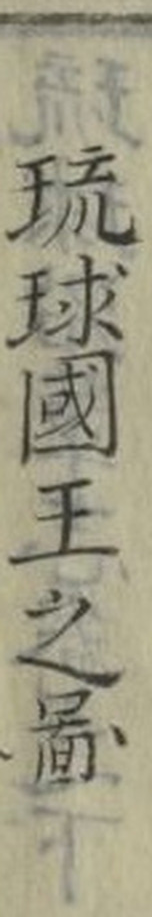琉球国王之図

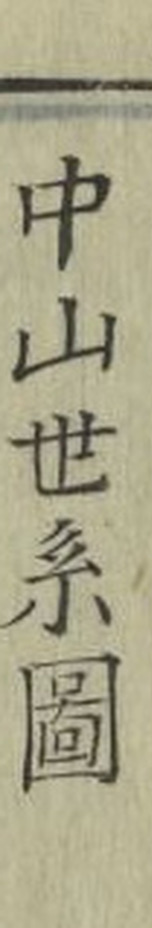中山世系図
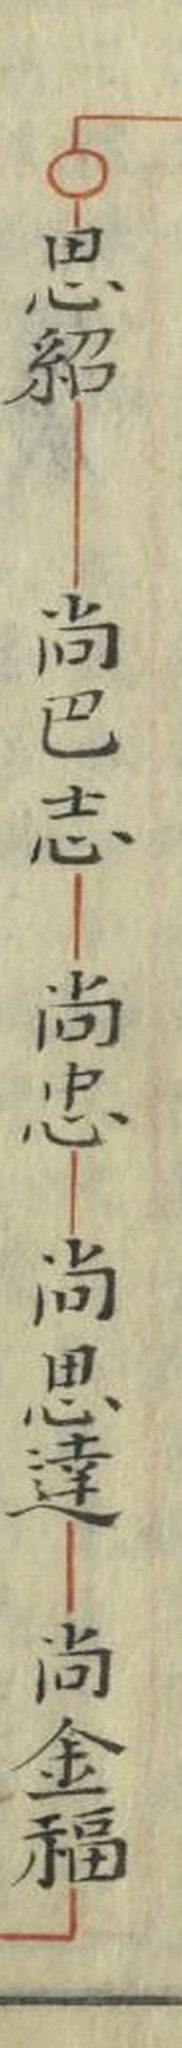┗〇恩紹━━尚巴志━尚忠━尚思達━尚金福┓

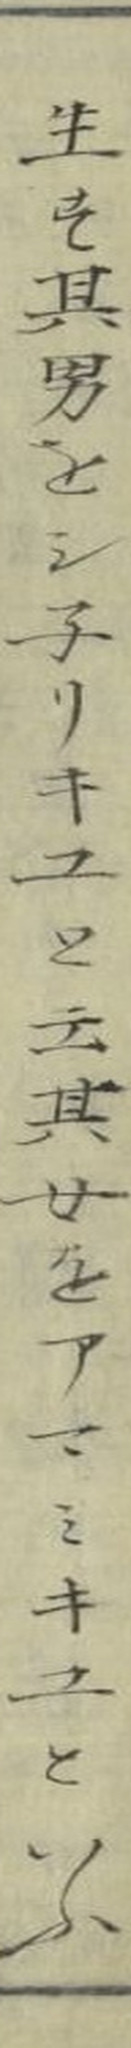生す其男をシネリキユといい云其女をアマミキユといふ
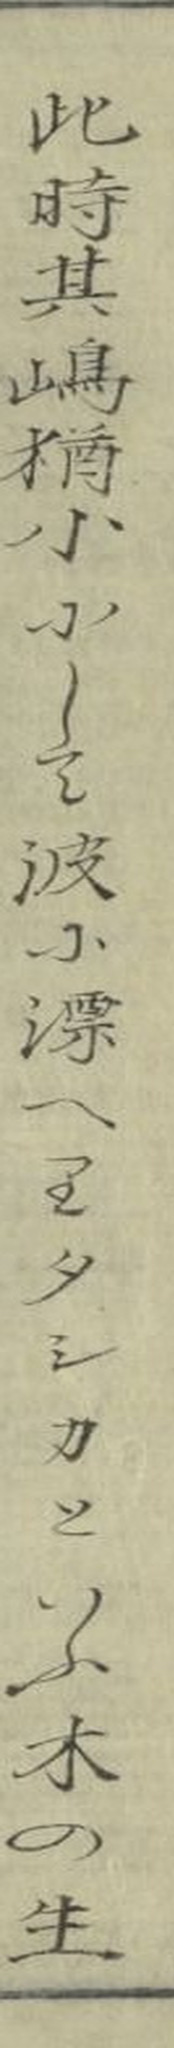此時其島奈緒猶小にして波に漂へりタシカといふ木の生
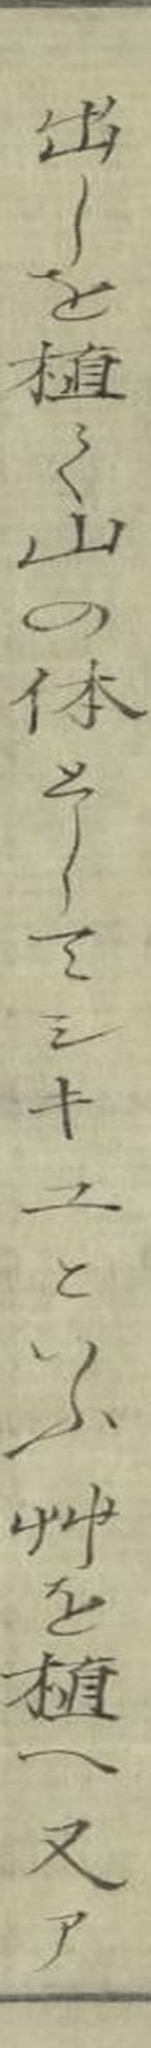出しを植て山の体としてシキユといふ草を植へ又ア
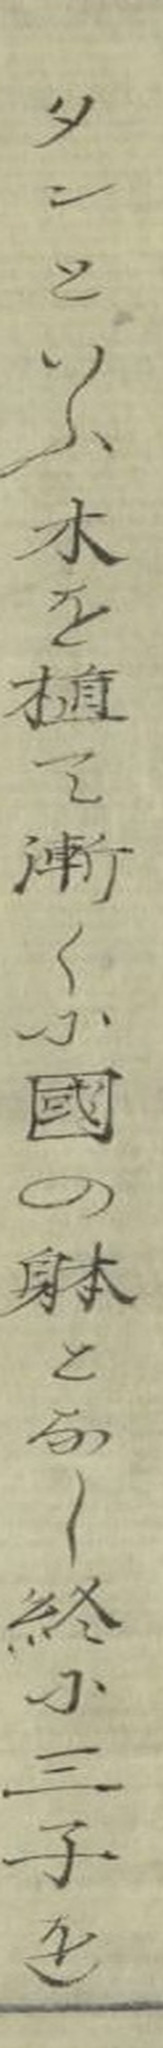タンといふ木を植て漸くに国の体となし終に三子を
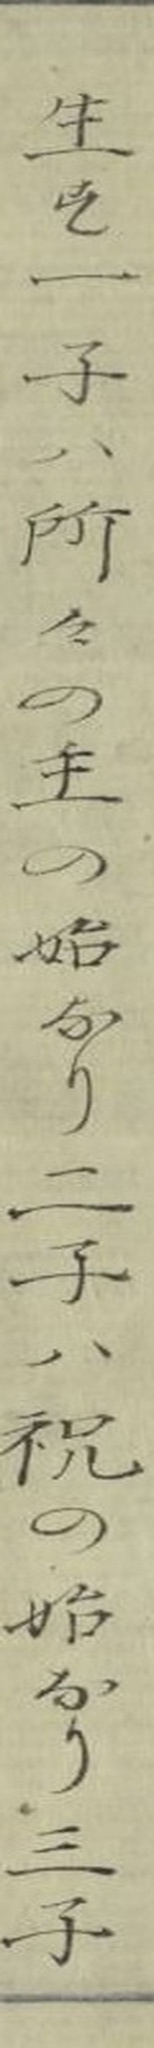生す一子は所々の主の始なり二子は祝の始なり三子
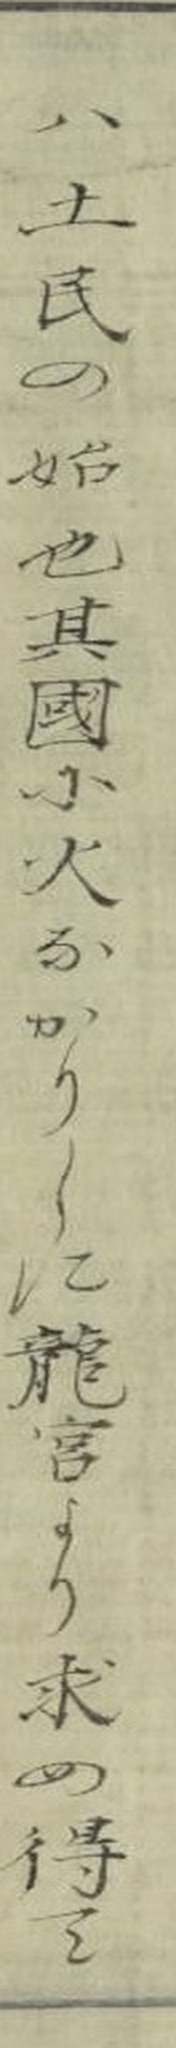は土民の始也其国に火なかりしに龍宮より求め得て
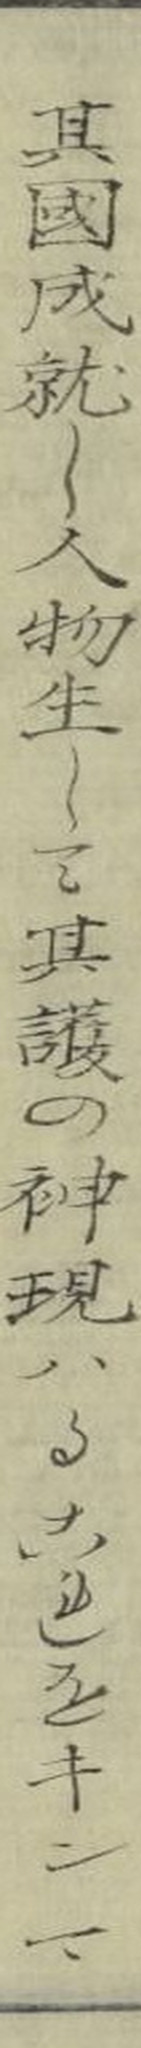其国成就し人物生して其護の神現はるこれをキンマ
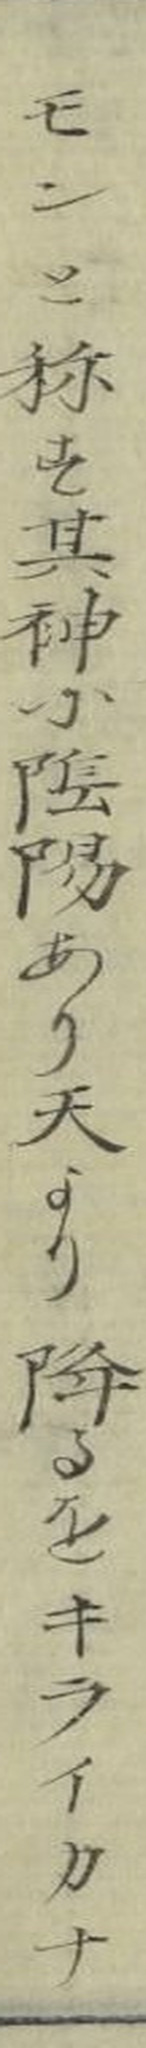モンと称す其神に陰陽あり天より降るをキライカナ
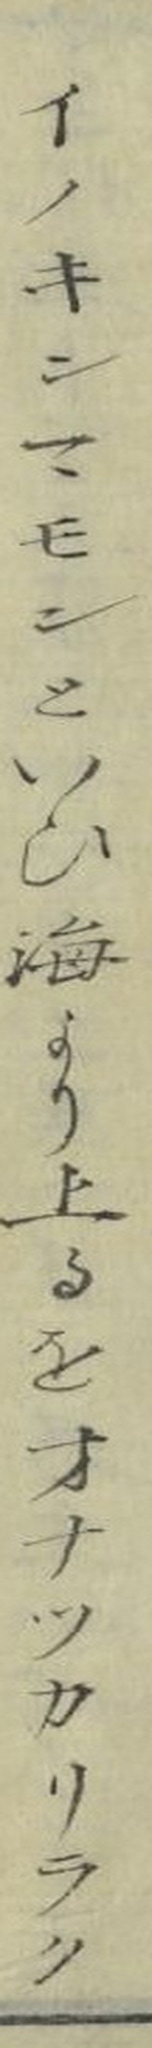イノキンマモンといひ海より上るをオナツカリラク
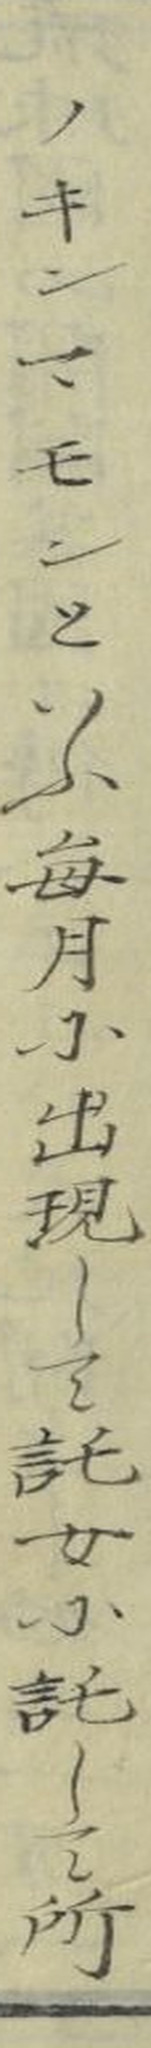ノキンマモンといふ毎月に出現して託女に託して所
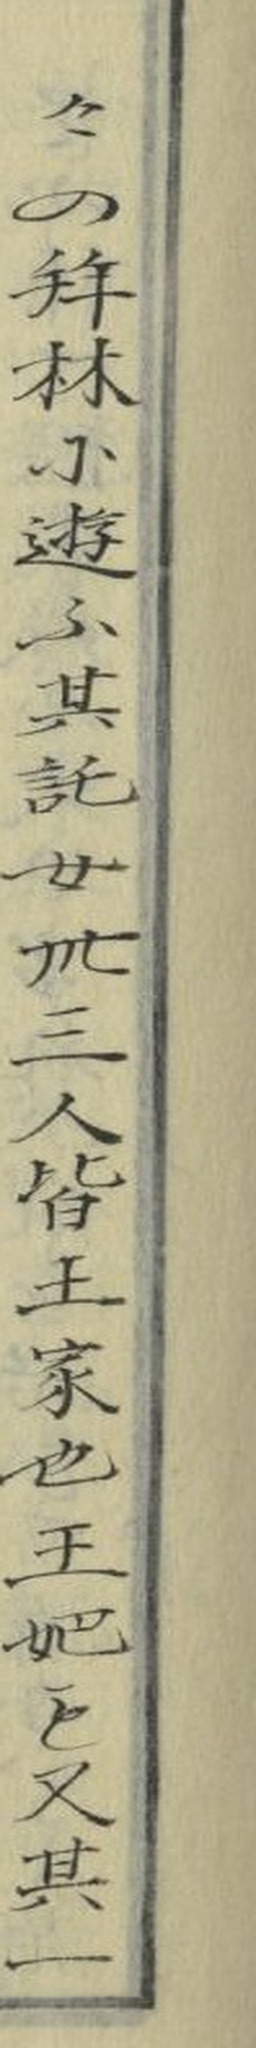々の拝林に遊ふ其託女卅三人皆王家也王妃も又其一
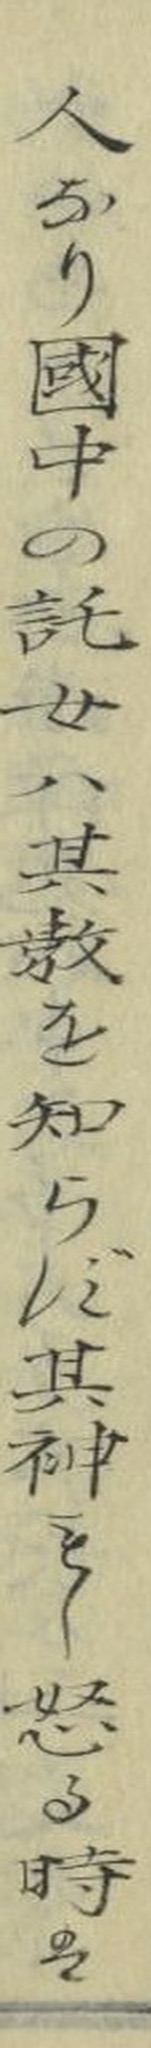人なり国中の託女は其数を知らず其神もし怒る時は
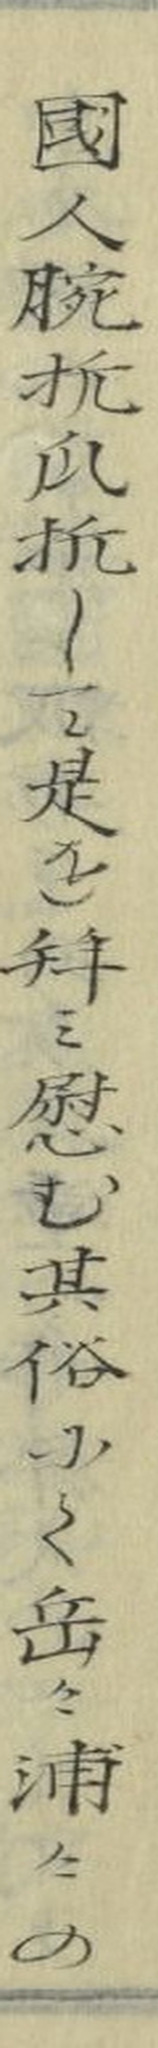国人腕折爪折して是を拝み慰む其俗にて岳々浦々の
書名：琉球沿革志 下
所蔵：University of the Ryukyus Library
